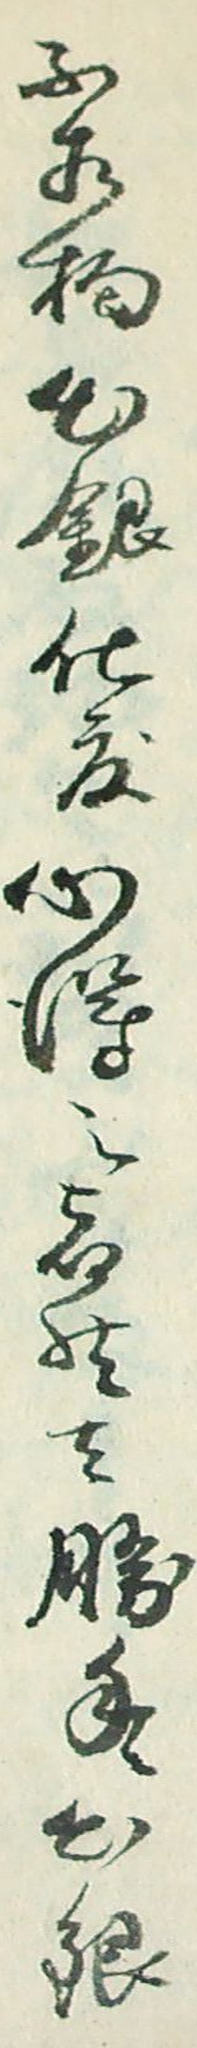不相拘出銀仕度心得之者共者勝手ニ出銀

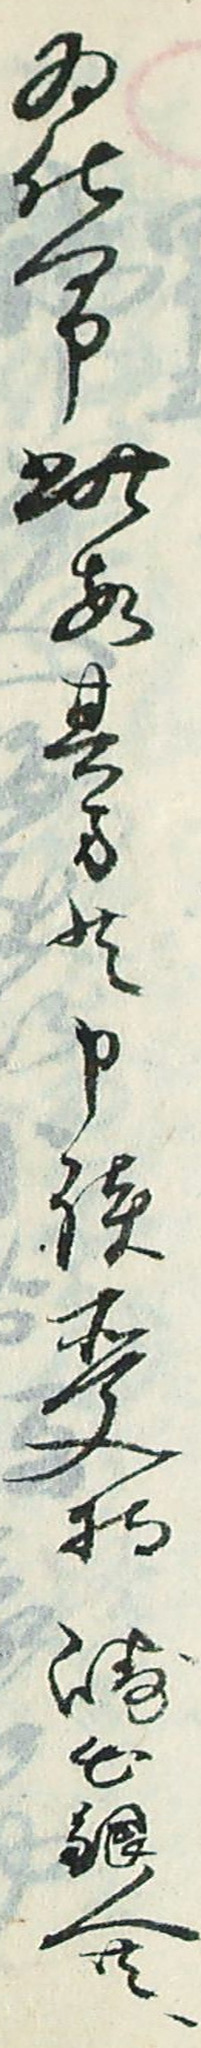為仕可申此段其方共へ申談受持崎出銀人共へ
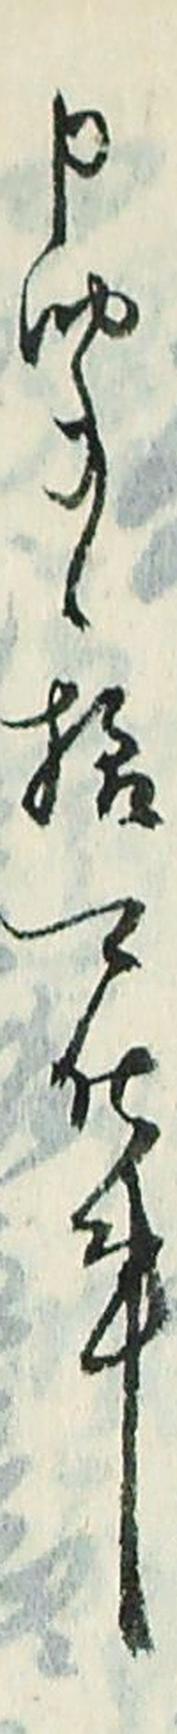申聞候様可仕事
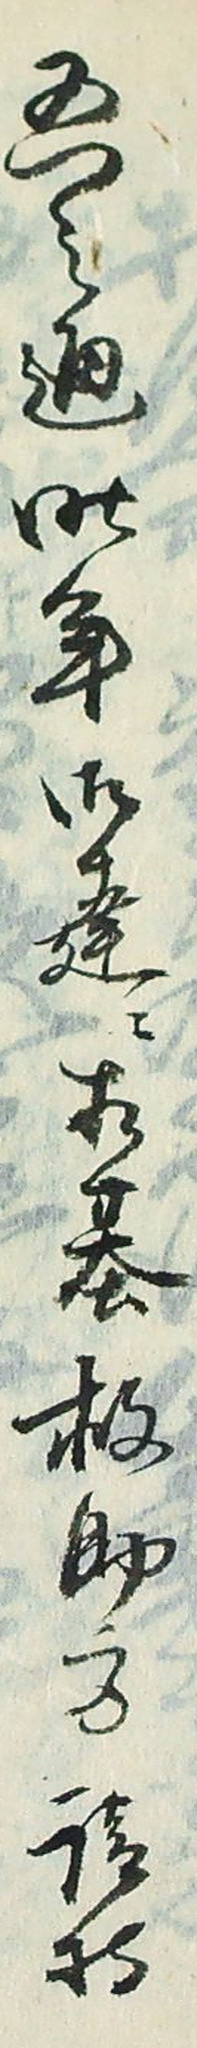右之通昨年御達ニ相基救助方請持
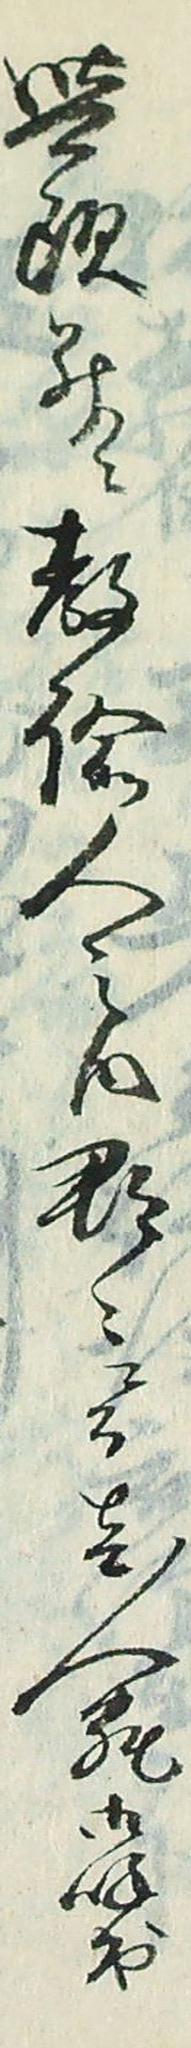與頭幷ニ教諭人之内郡々ニ而壱人宛御呼出
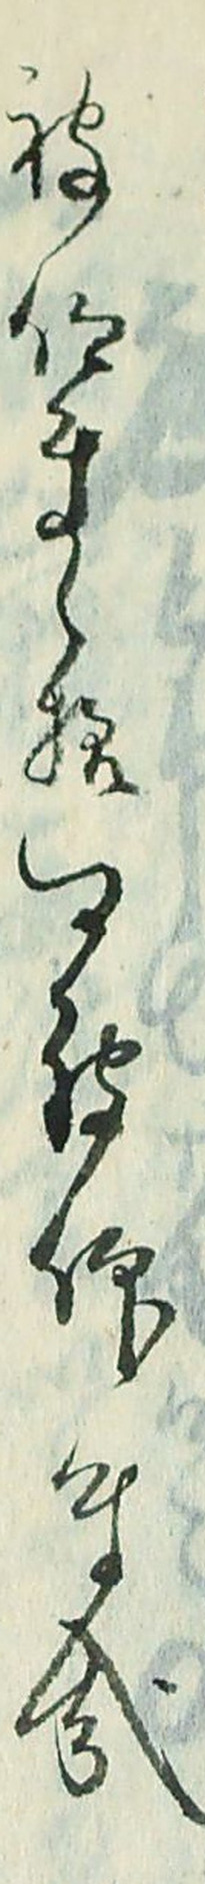被仰付候様可被仰付哉
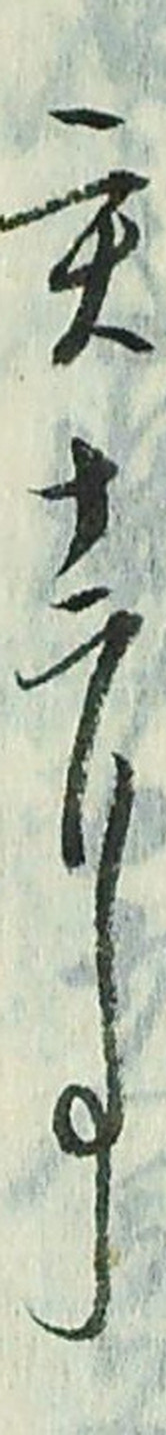亥十二月

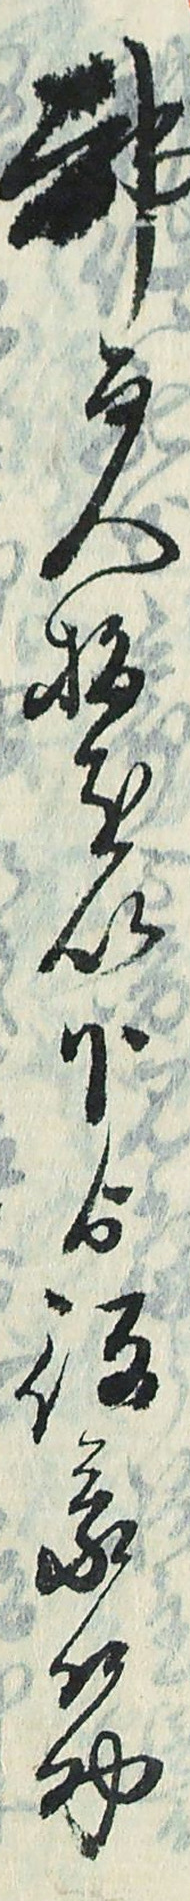都而人指を以下ゟ役義筋
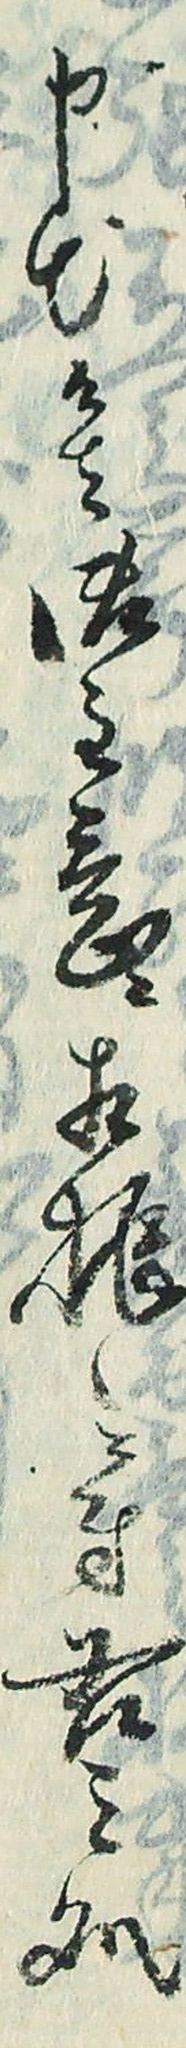申出候者御主意ニ相振候ニ付右之処
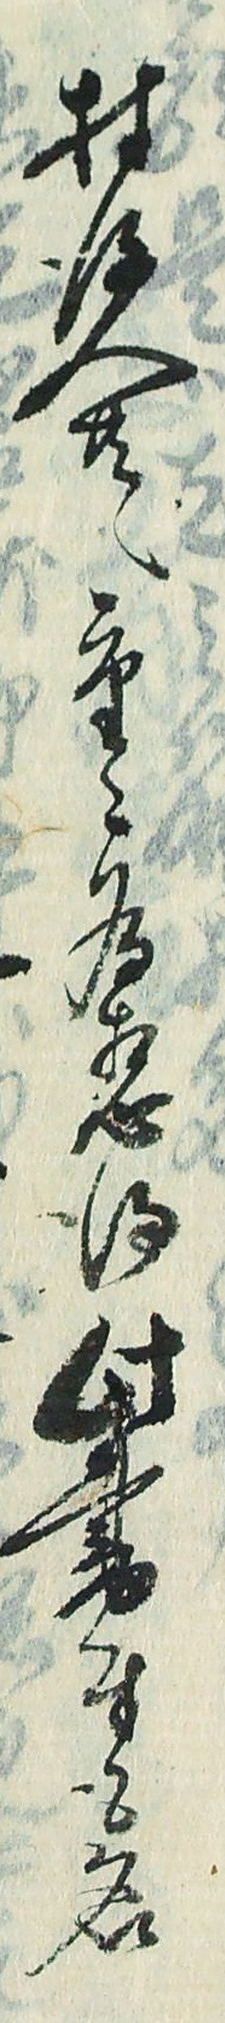村役人共へ重々為相心得此書付も名
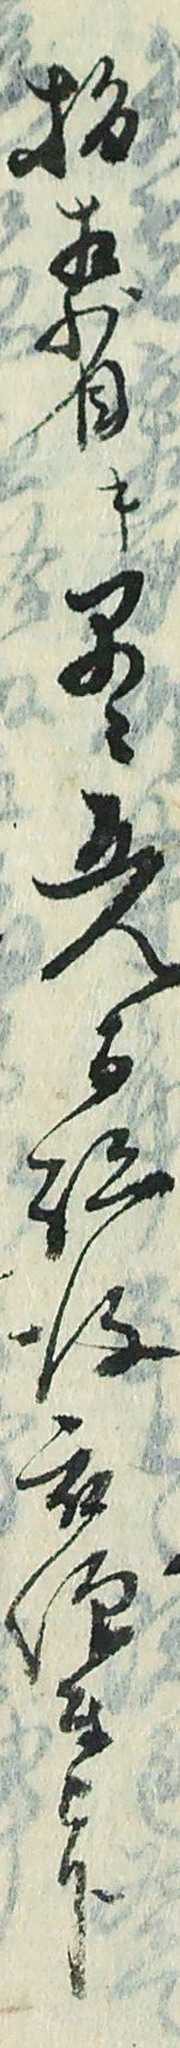指相省キ早々五人与跡役被仰付被下
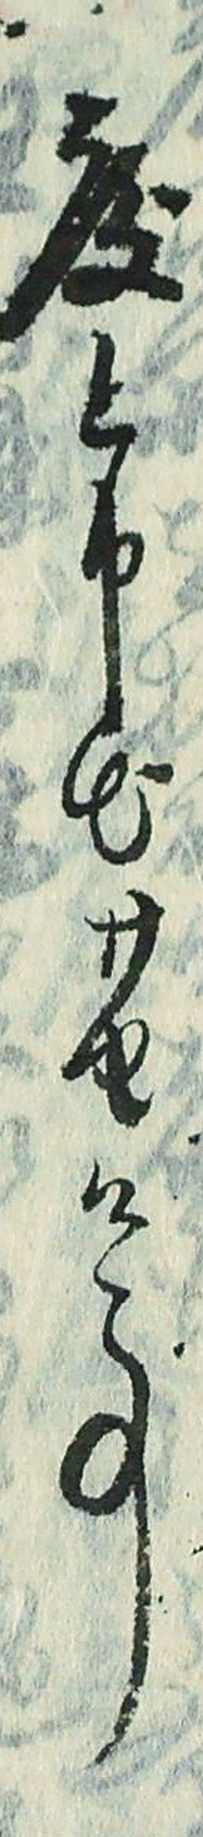度と申出サセ候事
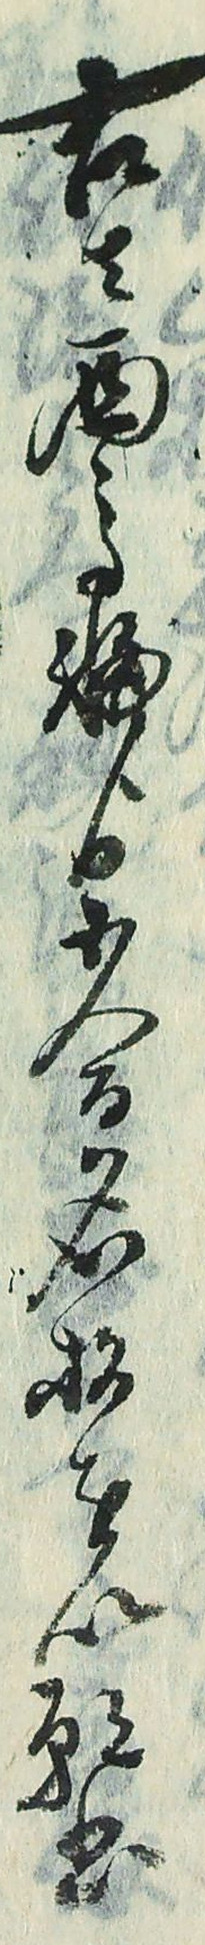右者西高輪ゟ五人与名指を以願出
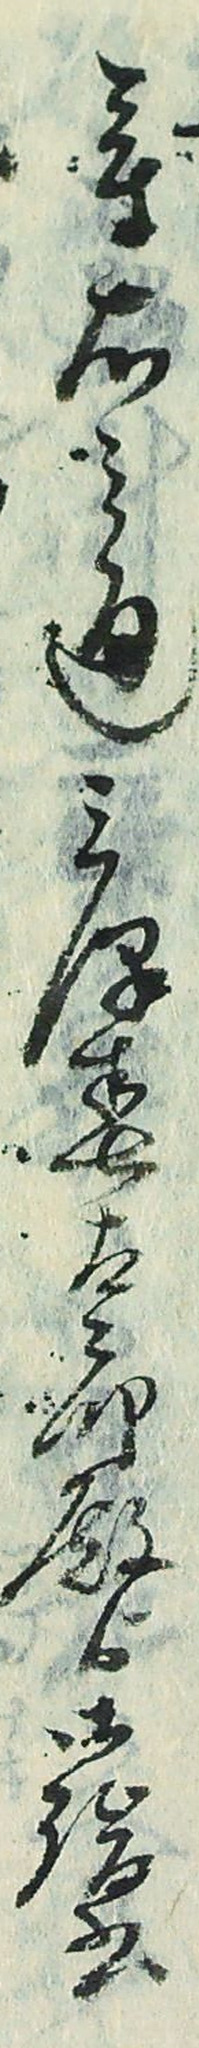ニ付右之通三澤春太郎殿ゟ御端書
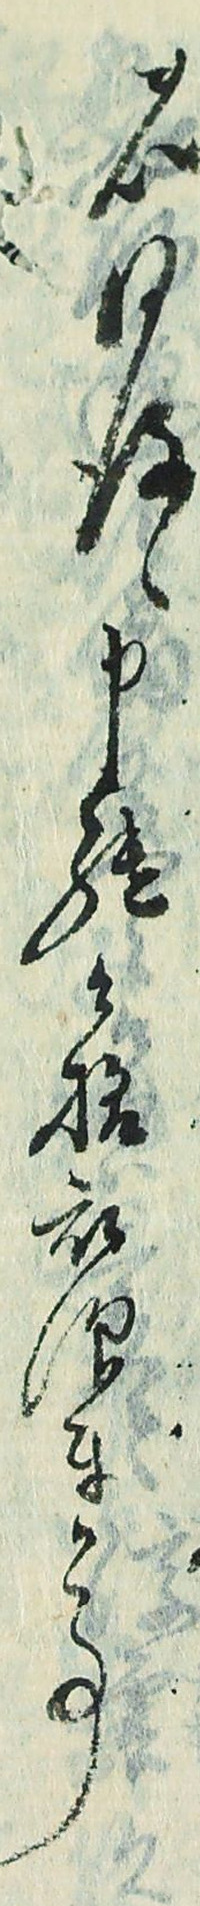ヲ以同役へ申継候様被仰付候事
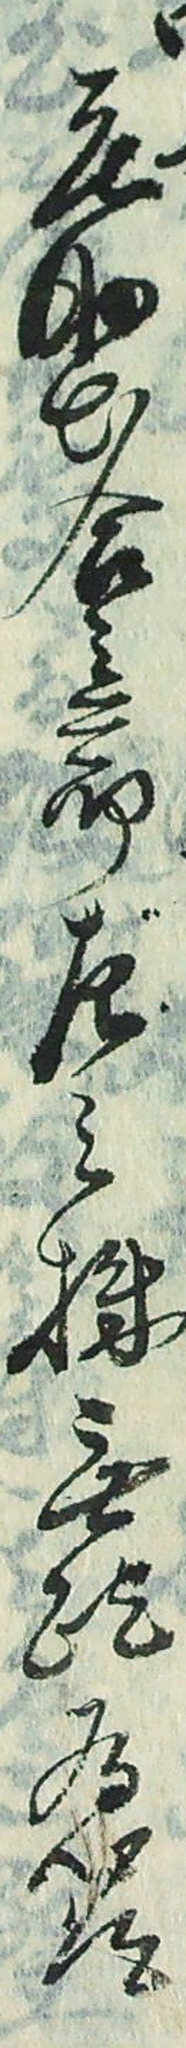庄助出合之節左之株無屹為心得
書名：諸御趣意書并御下知向之写
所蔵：鳴門教育大学 Naruto University of Education
